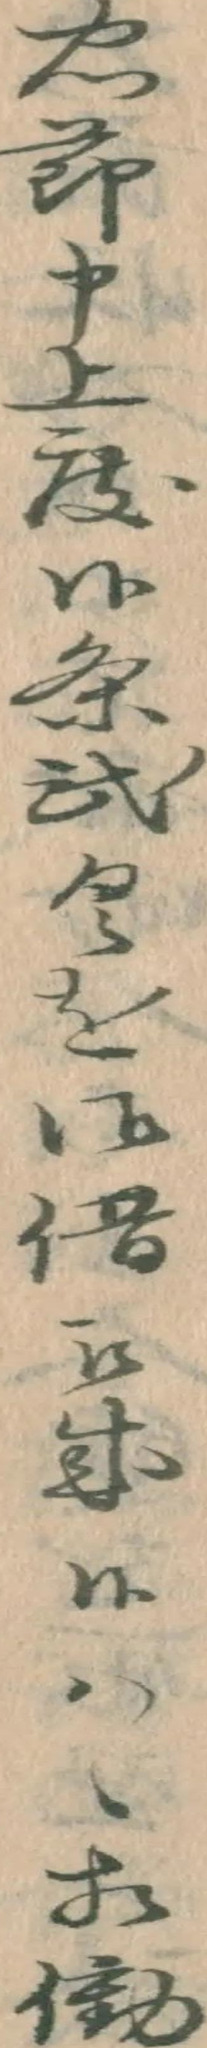忠節申上度候条武具を御借被成候はゝ相働
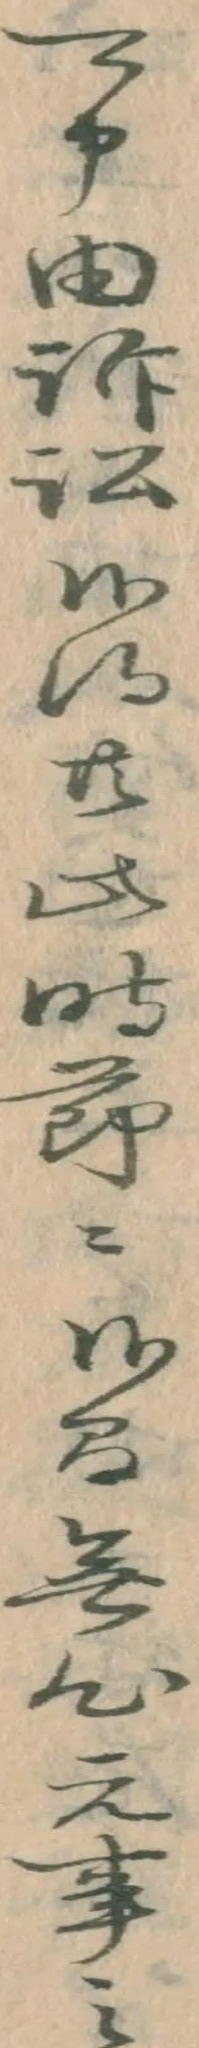可申由訴訟候得共此時節に候間無心元事之
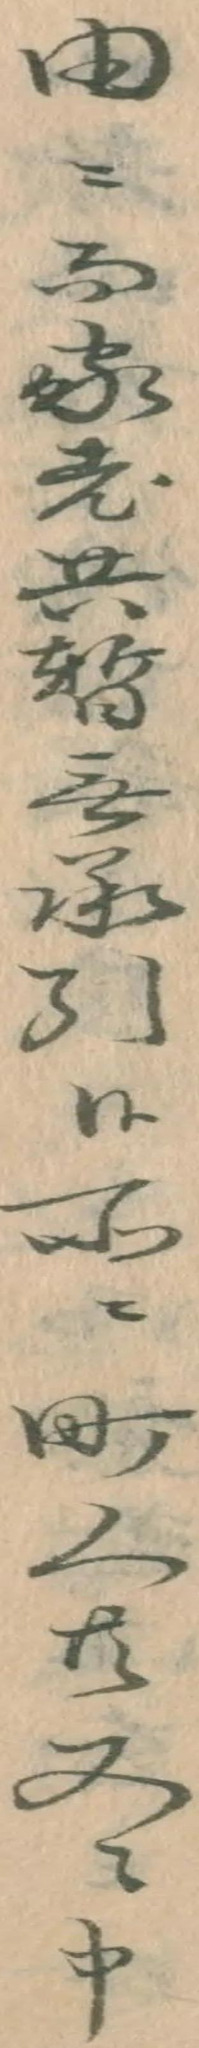由に而家老共暫無承引候所に町人と共又々申

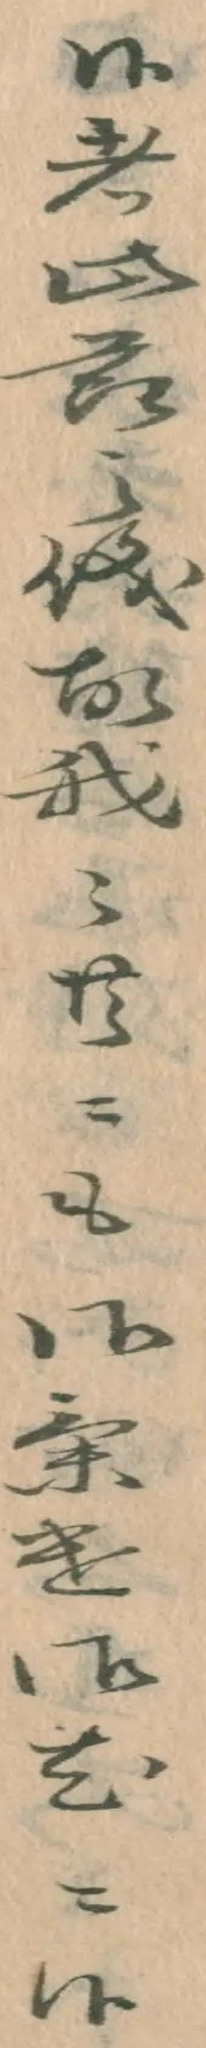候者此節之儀故我々共にも御参遣御尤に候
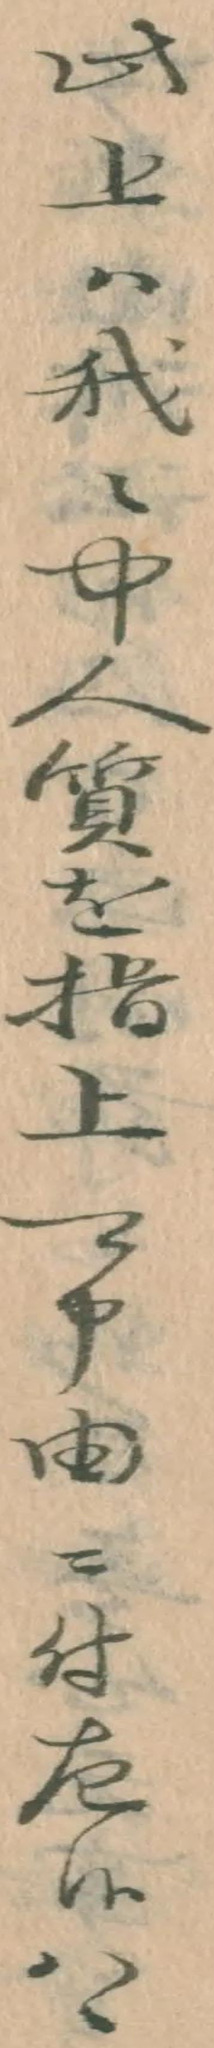此上は我々中人質を指上可申由に付左候はゝ
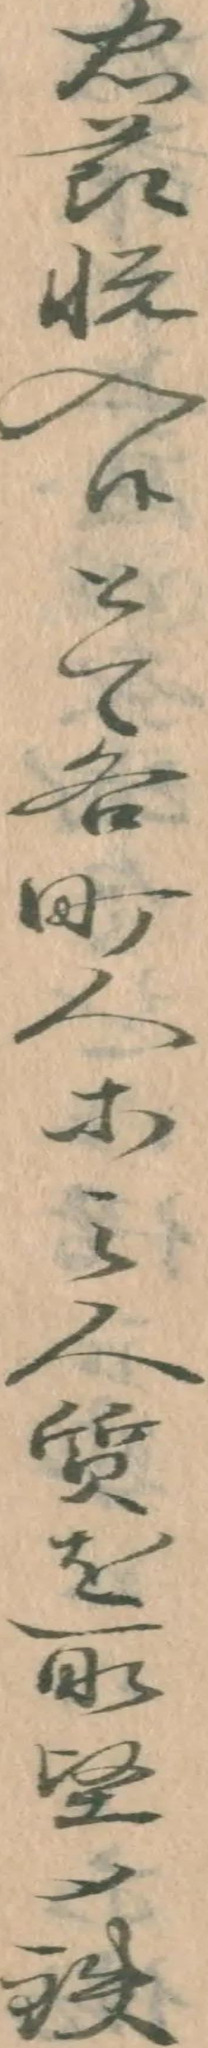忠節悦入候とて各町人等之人質を所望して鉄
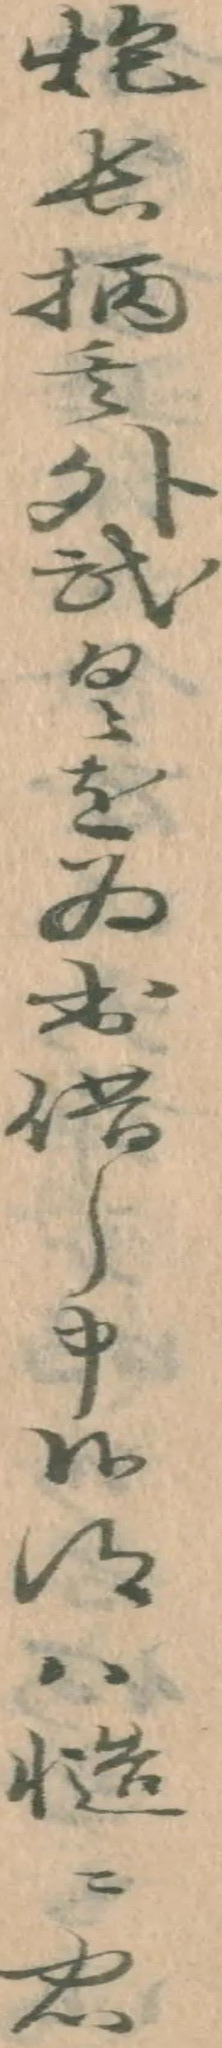炮長柄其外武具を為出借し申候得は慥に忠
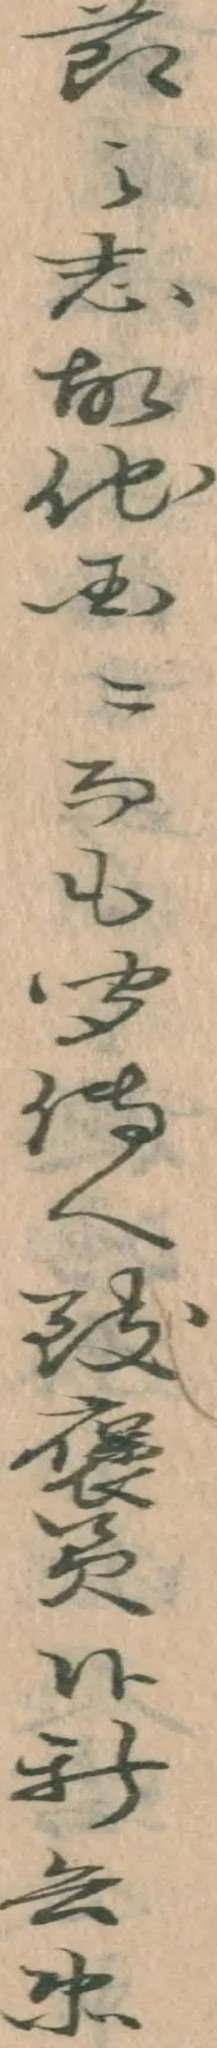節之志故他国に而も聞伝へ致褒美候新兵衛
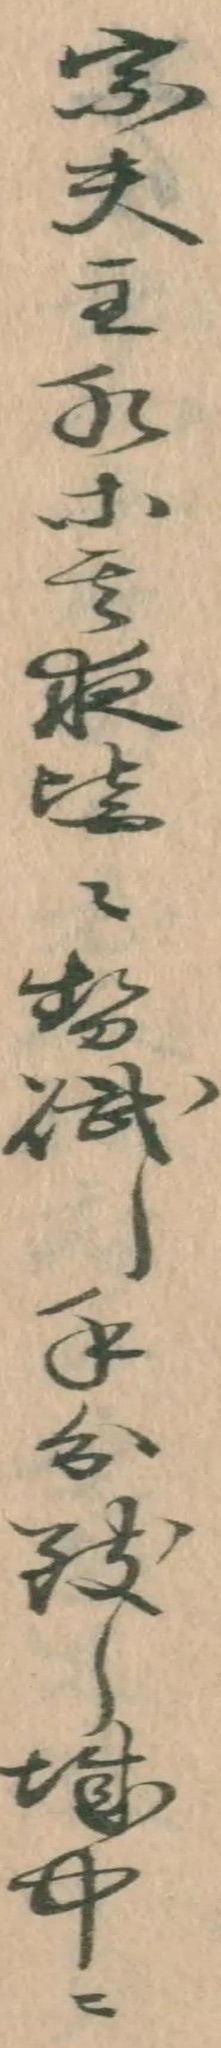宗夫主水等其夜皆々勢賦し手分致城中に
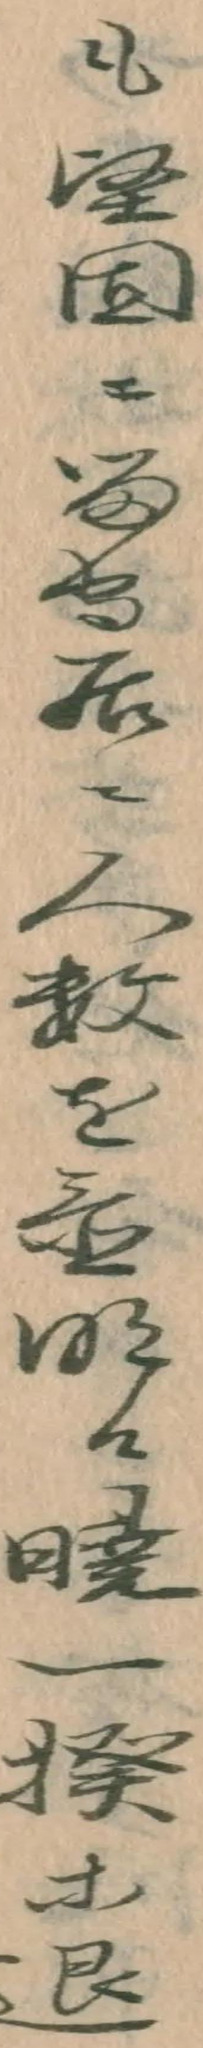も堅固に留守居に人数を置明々暁一揆等退
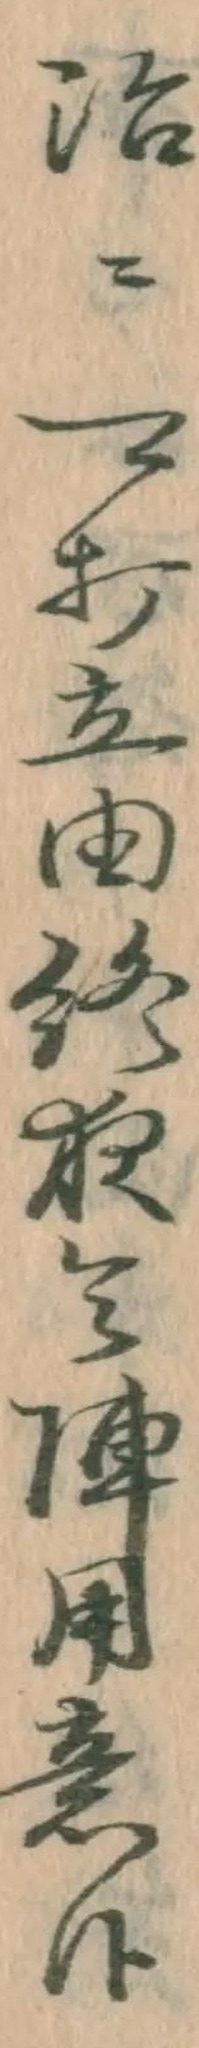治に可打立由終夜令陣用意候
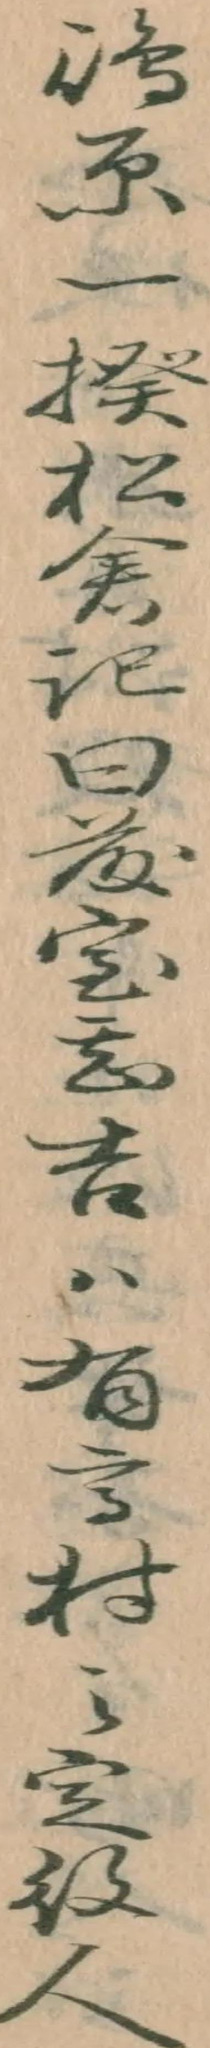島原一揆松倉記日藤宝甚吉は有馬村之定役人
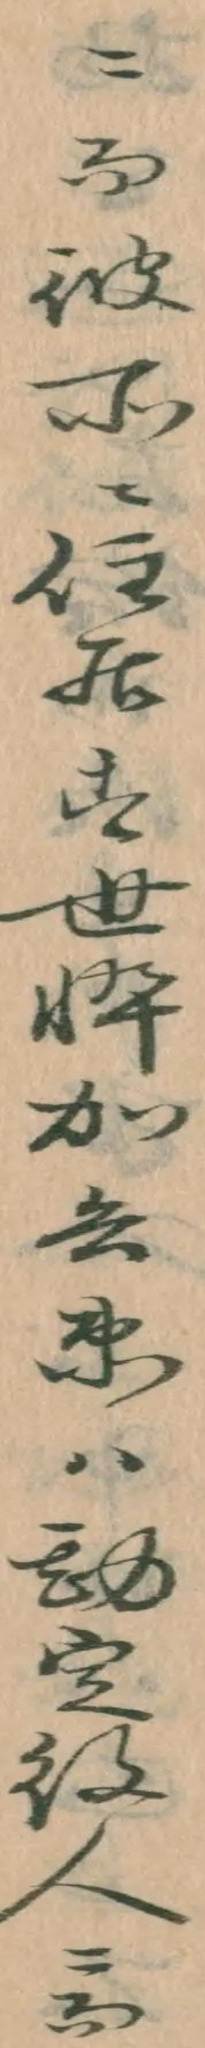に而彼所に住居す世倅加兵衛は勘定役人に而
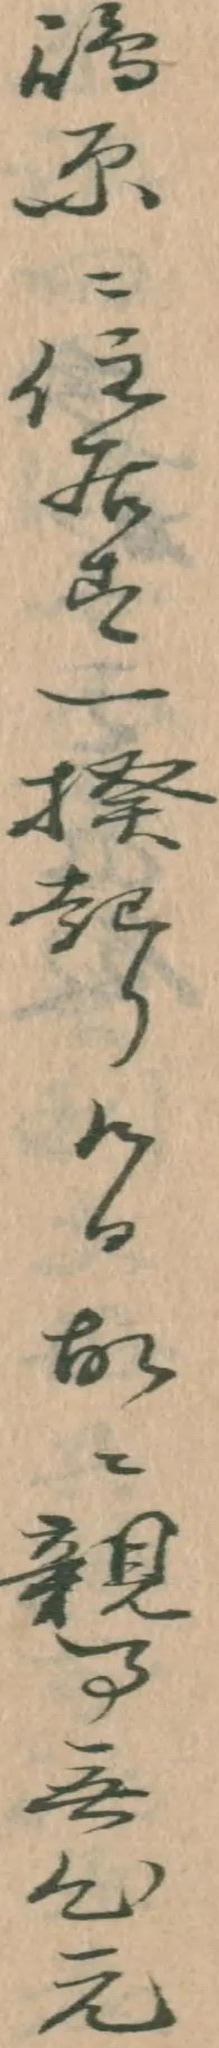島原に住居す一揆起りける故に親子無心元
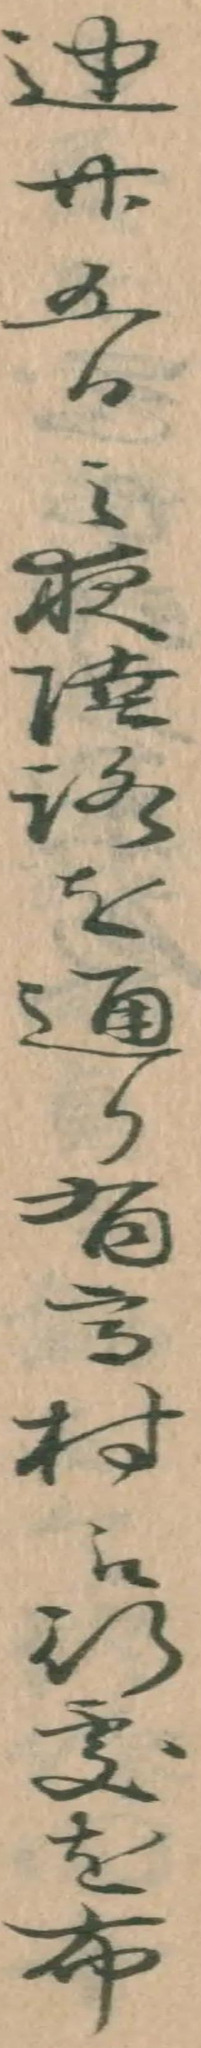迚廿五日之夜陸路を通り有馬村え行処を布
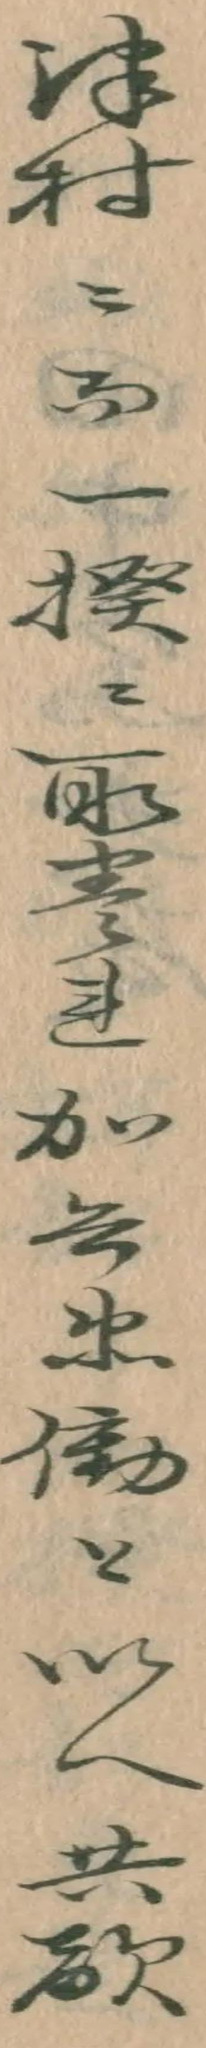津村に而一揆に取巻れ加兵衛働といへ共敵
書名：切支丹御退治記 49巻. [1]
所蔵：国立国会図書館 National Diet Library, JAPAN
